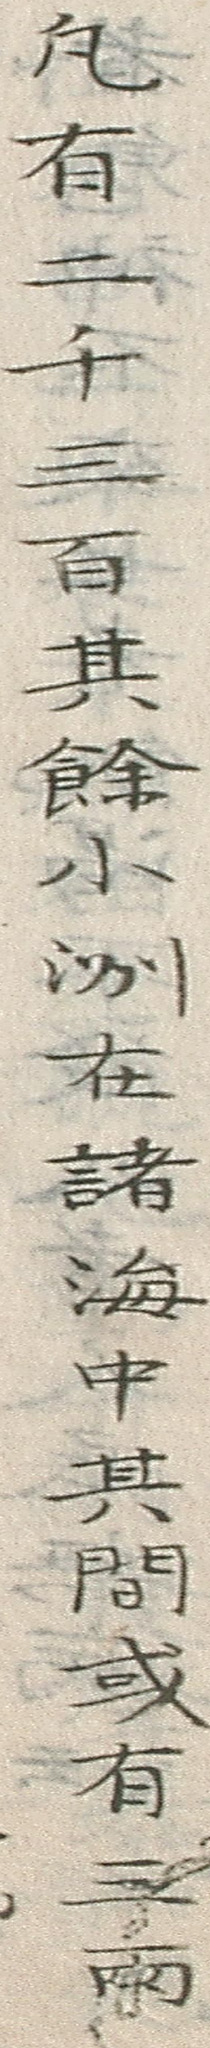凡有二十三百其余小洲在諸海中其間或有三両
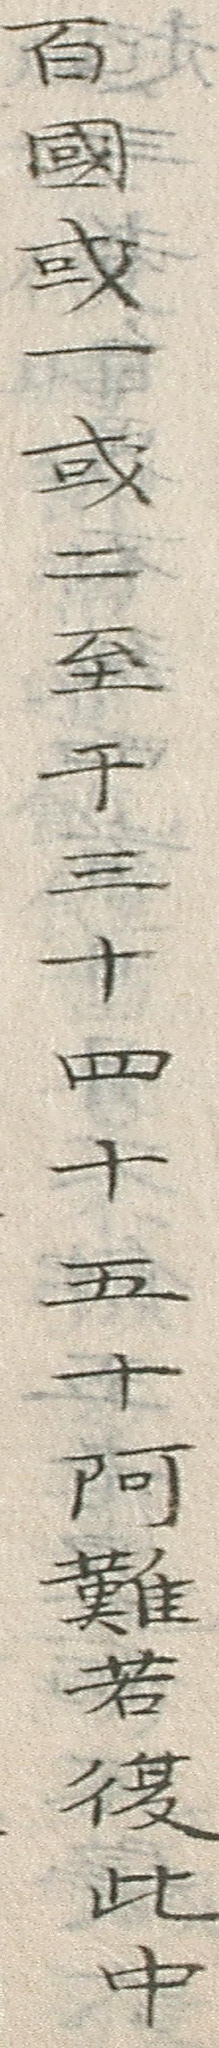百国或一或二至于三十四十五十阿難若復此中
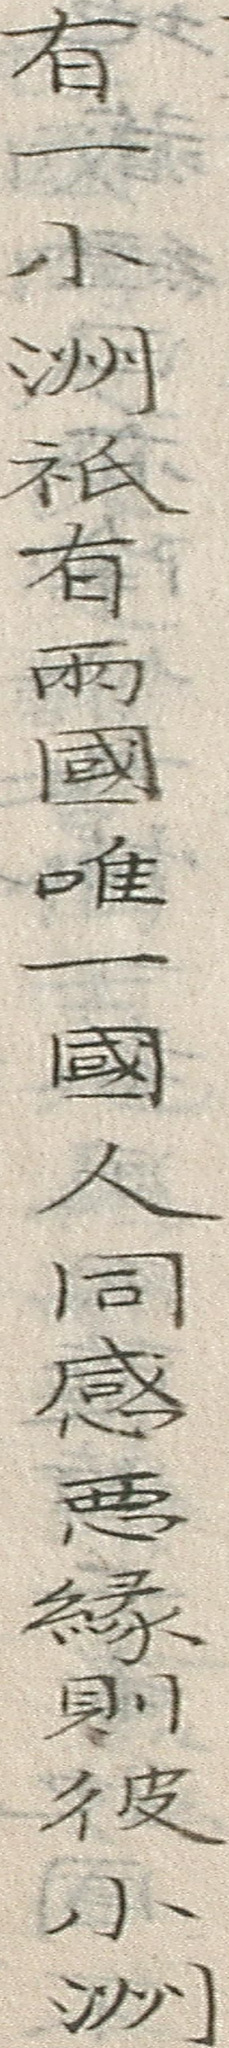有一小洲祇有両国唯一国人同感悪縁則彼小洲
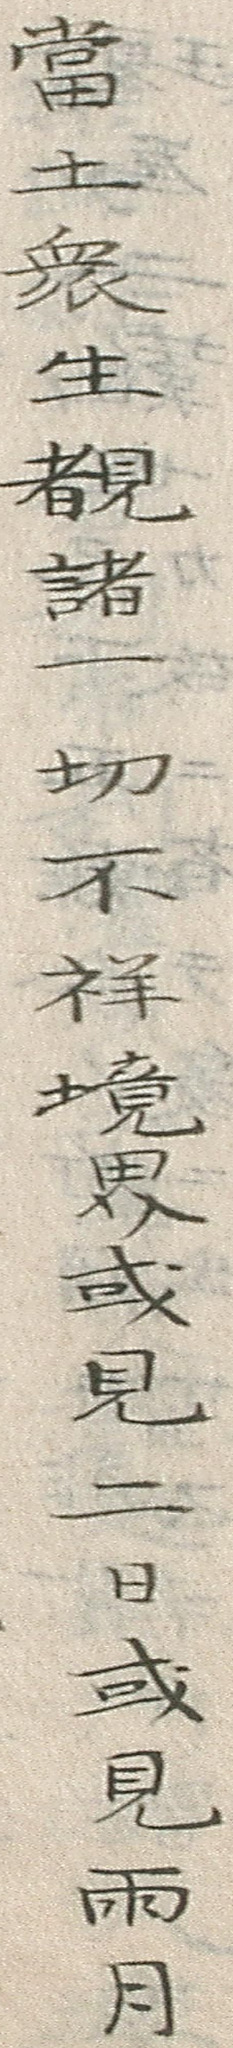当土衆生覩諸一切不詳境界或見二日或見両月
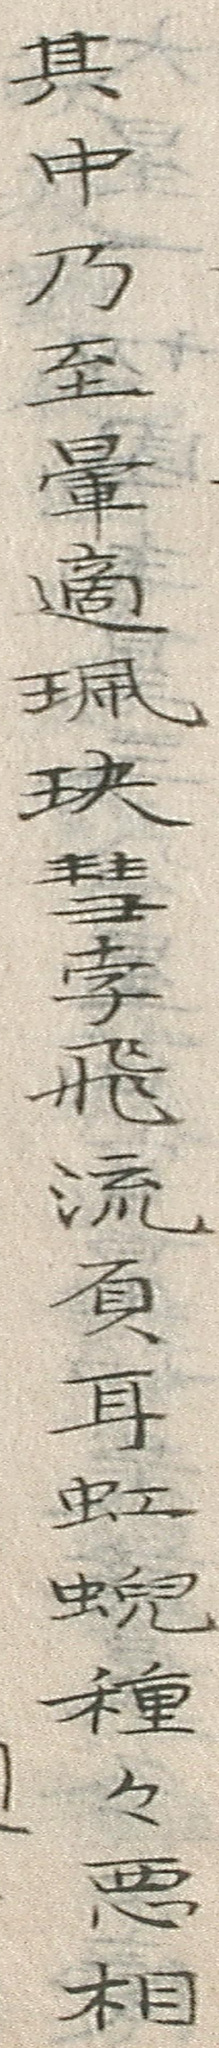其中乃至暈適珮玦彗孛飛流負耳虹蜺種々悪相
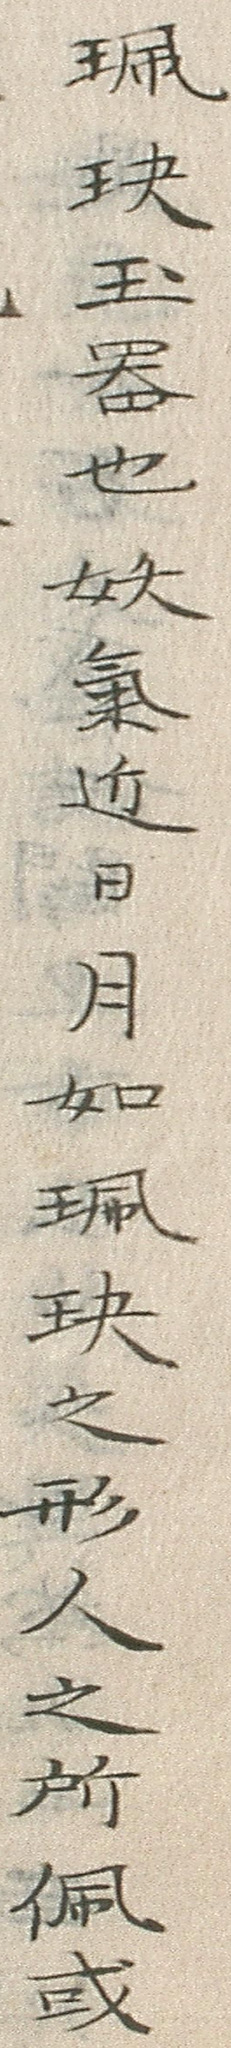珮玦玉器也妖気近日月如珮玦之形人之所佩或
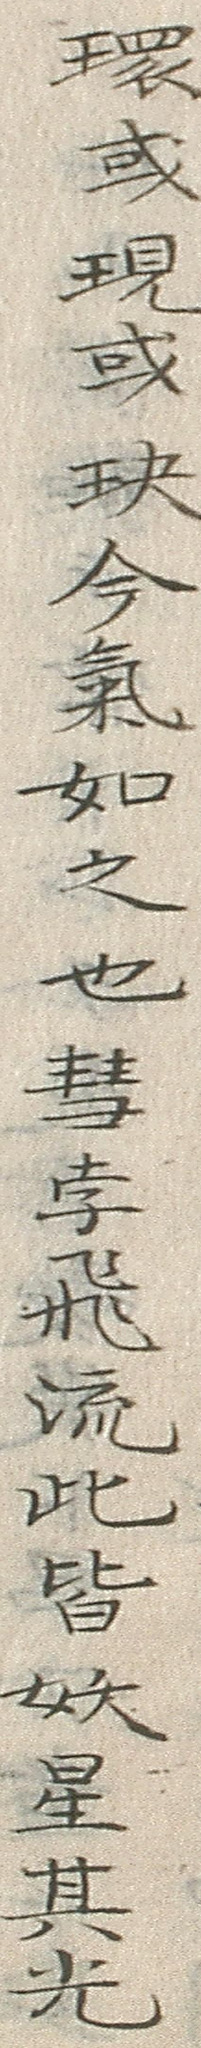環或現或玦今気如之也彗孛飛流此皆妖気其光
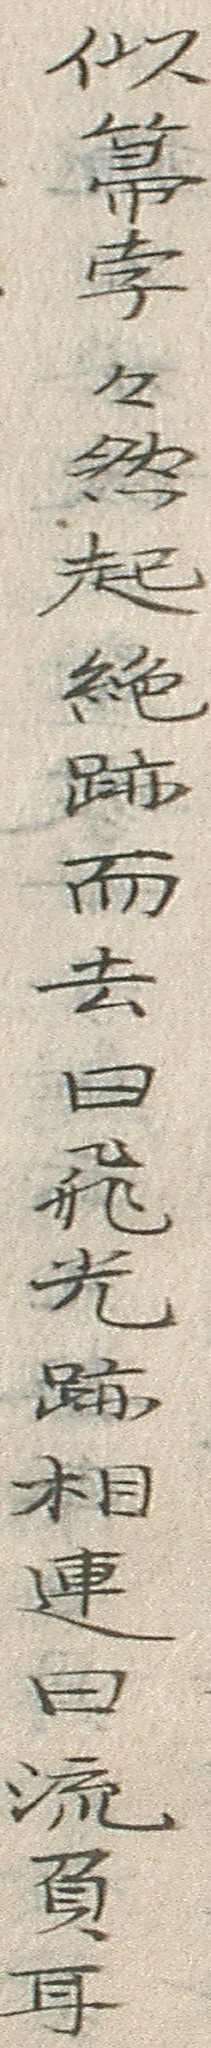以箒孛々然起絶跡而去曰飛光跡相連日流負耳
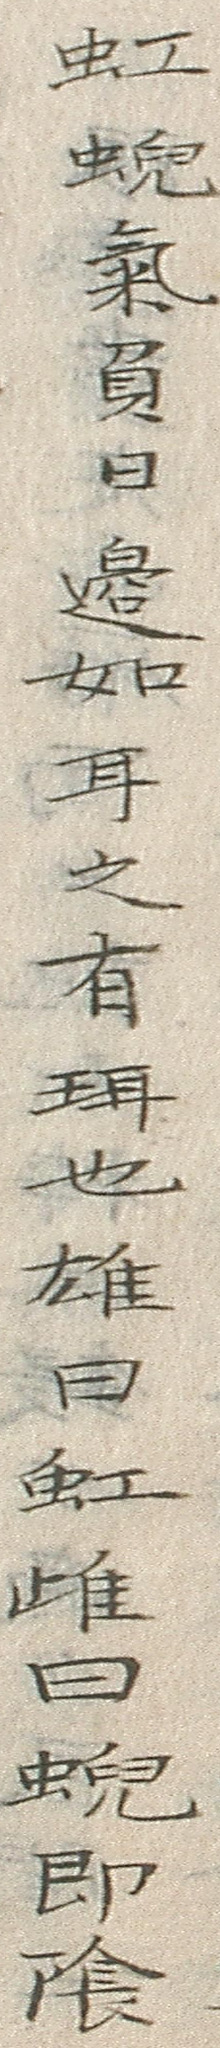虹蜺気負日辺如耳之有珥也雄曰虹雌曰蜺即陰
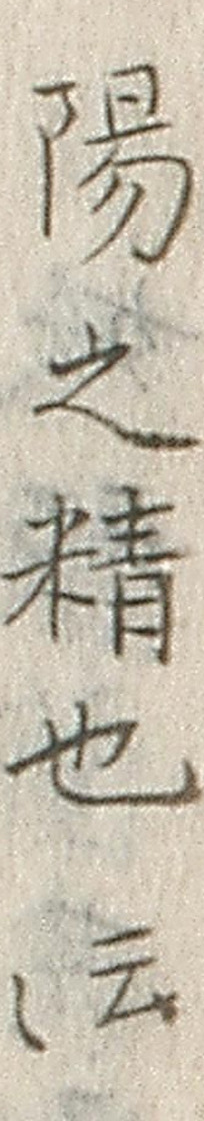陽の精也云〻
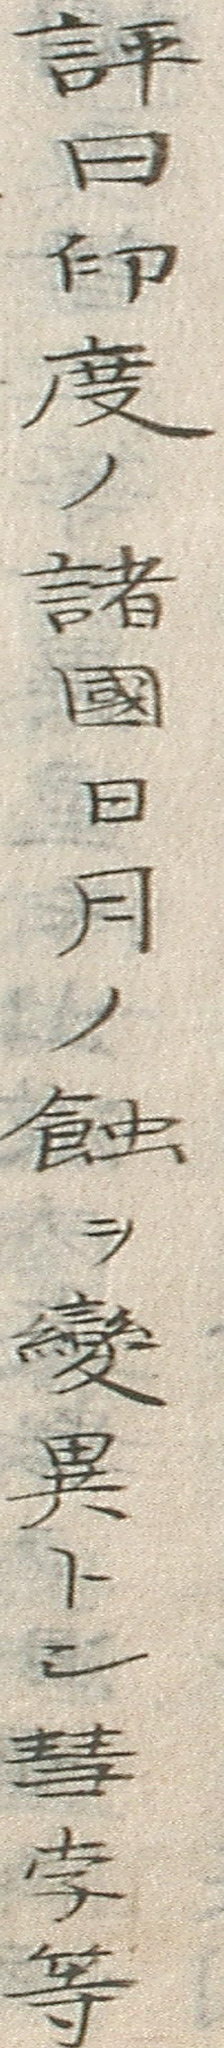評曰印度ノ諸国日月ノ蝕ヲ変異トシ彗孛等
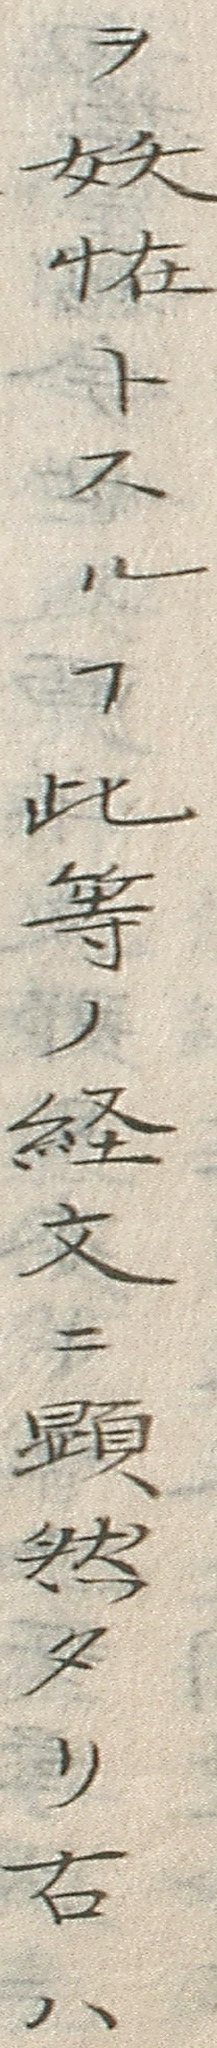ヲ妖怖トスルコト此等ノ経文ニ顕然タリ古ハ
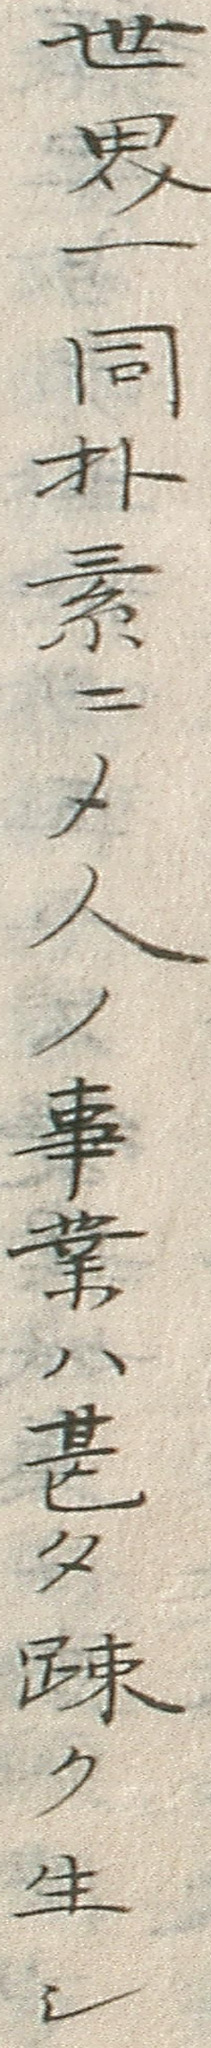世界一同朴素ニシテ人ノ事業ハ甚タ疎ク生シ
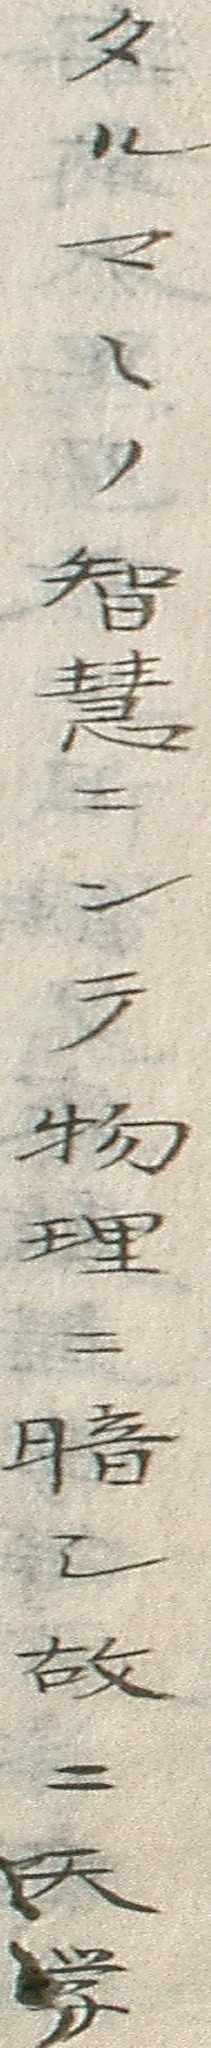タルマヽノ智慧ニシテ物理ニ暗シ故ニ天学
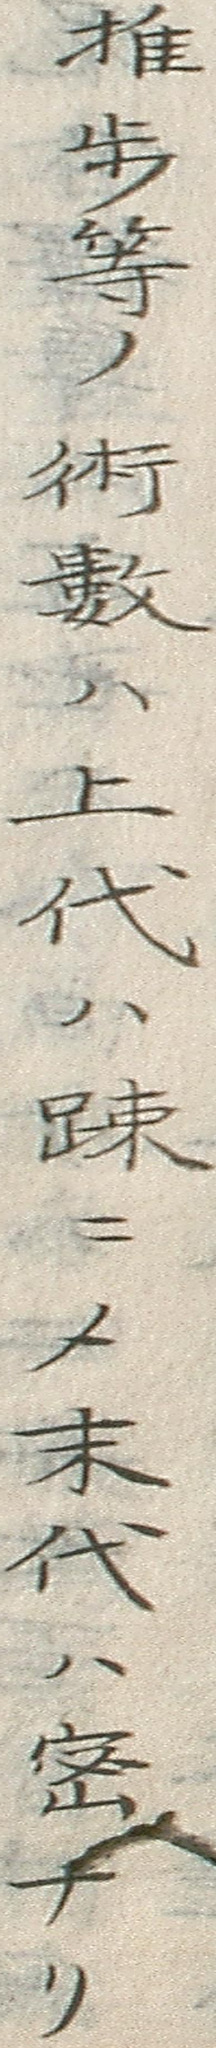推歩等ノ術数ハ上代ハ疎ニシテ末代ハ密ナリ

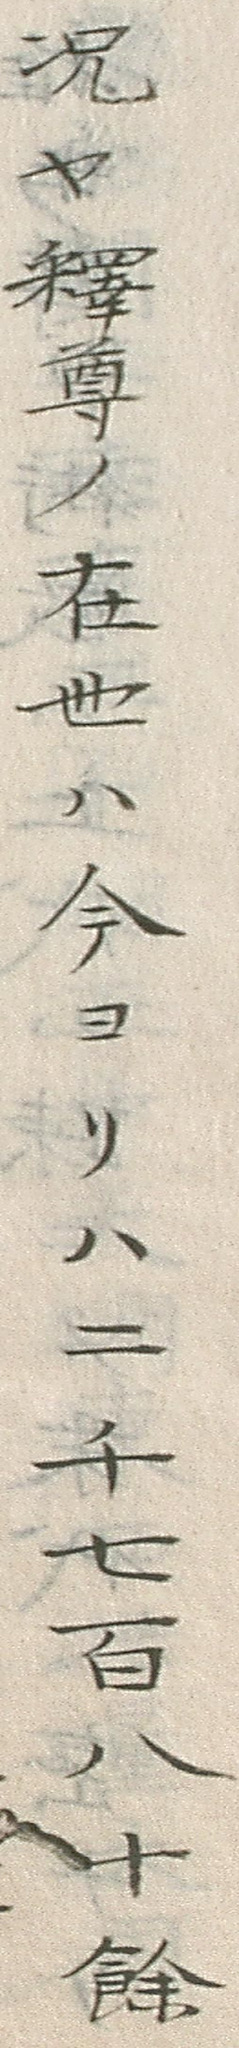況ヤ釈尊ノ在世ハ今ヨリハ二千七百八十余
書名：天學略名目羽翼　全
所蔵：東京大学地震研究所図書室 Earthquake Research Institute Library, The University of Tokyo, JAPAN
